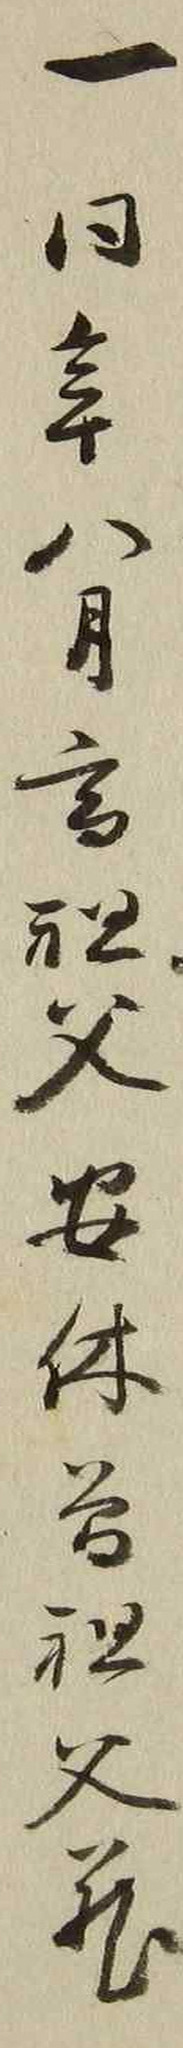一同年八月高祖父安休曽祖父蔵
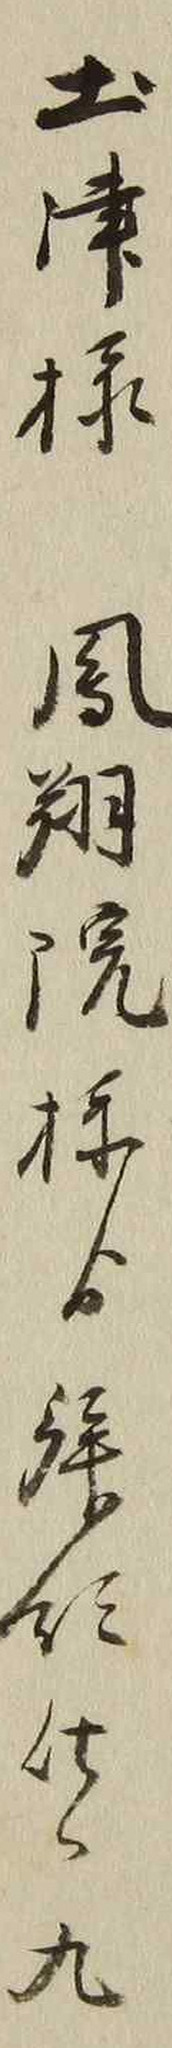土津様鳳翔院様ゟ拝領仕候九
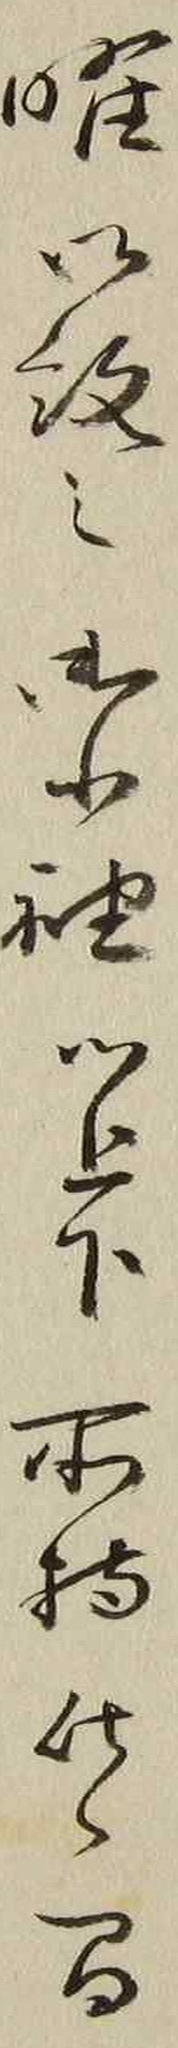曜御紋之御小袖御上下所持仕候間
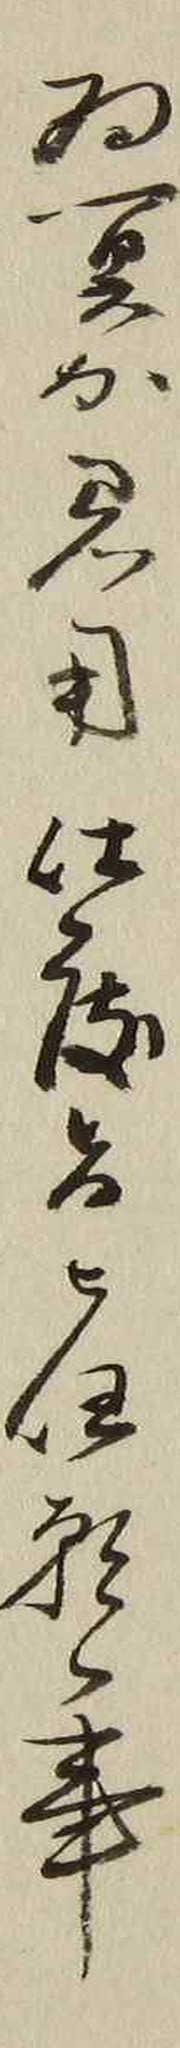為冥加着用仕度旨被任願候事
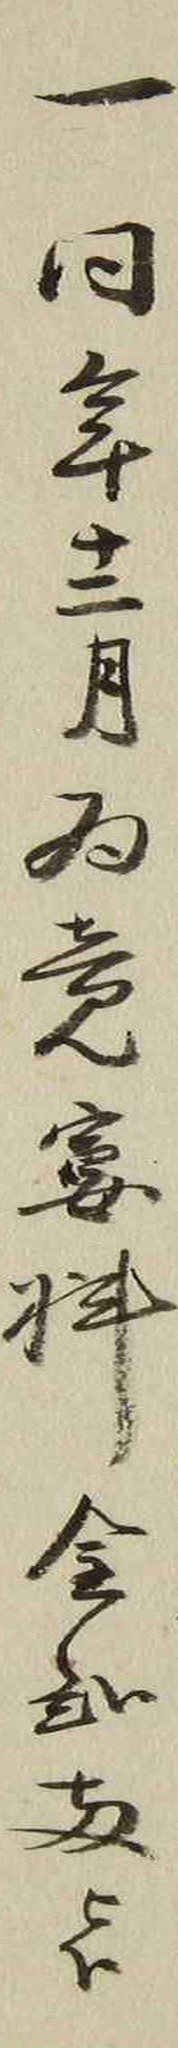一同年十二月為竟宴料金弐両被下
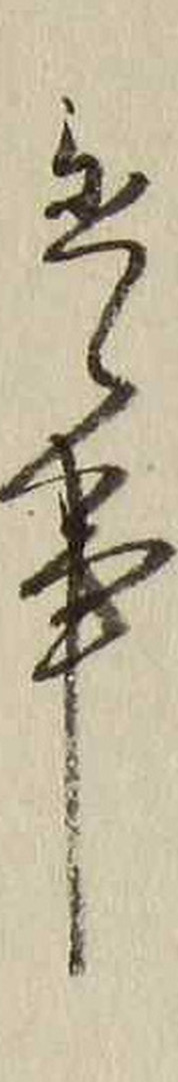置候事
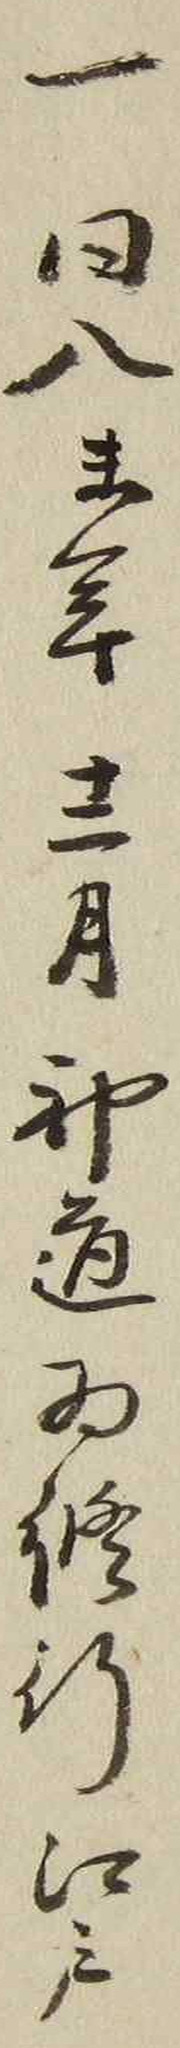一同八未年十二月神道為修行江戸
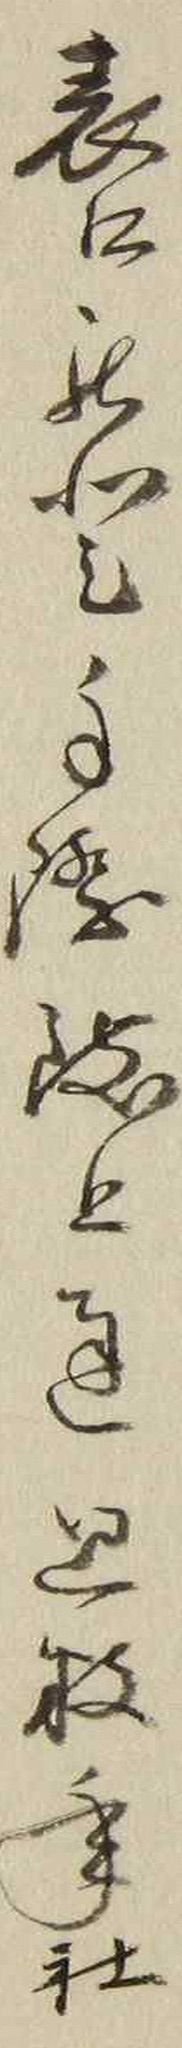表江罷登手際致上達且数年社
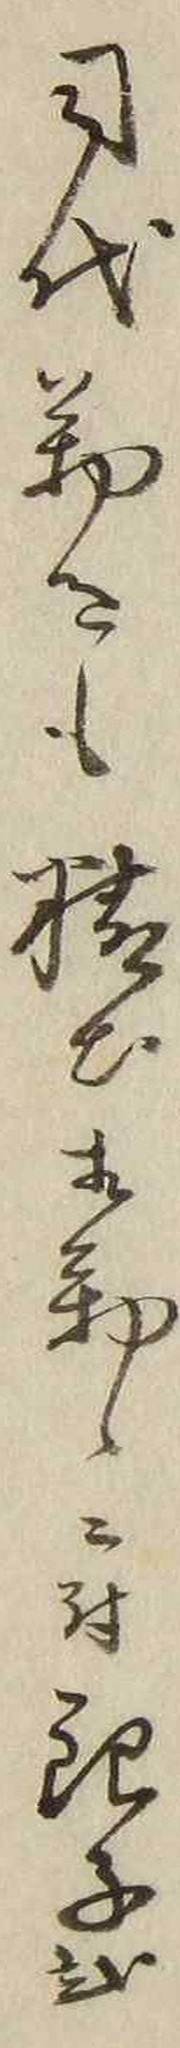司代勤をも精出相勤候ニ付銀子弐
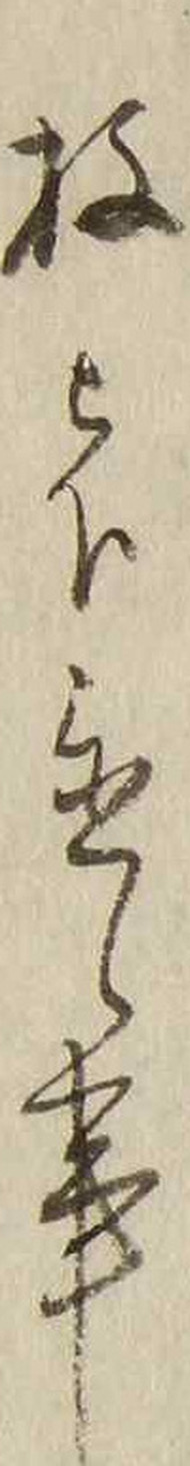枚被下置候事

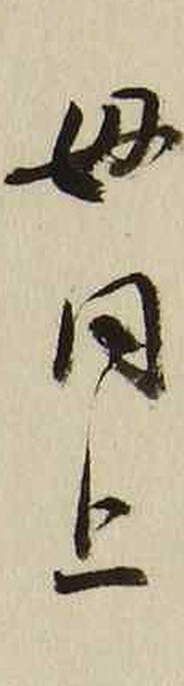母同上
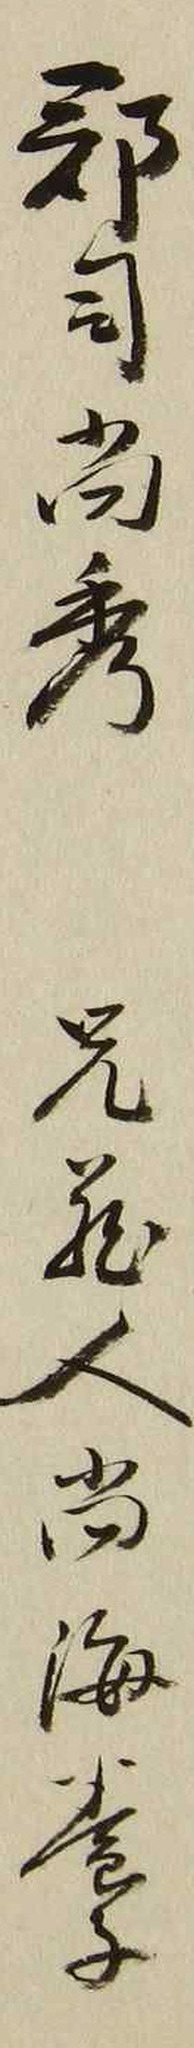郡司尚秀兄蔵人尚海養子
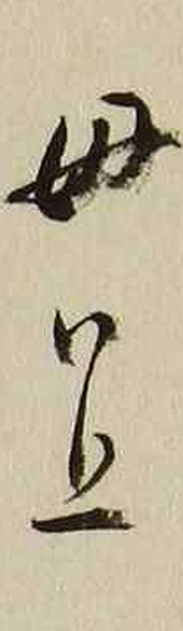母同上
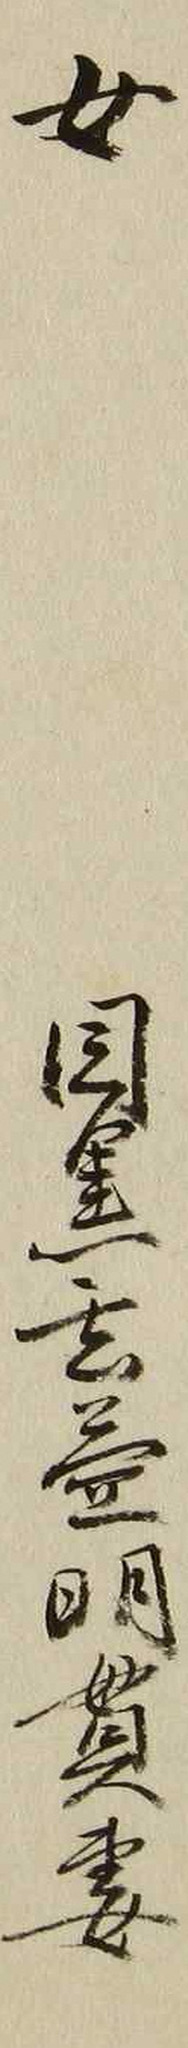女目黒玄益明貫妻
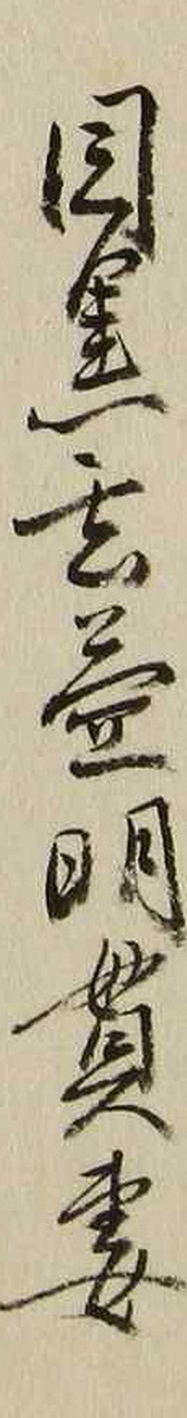女目黒玄益明貫妻
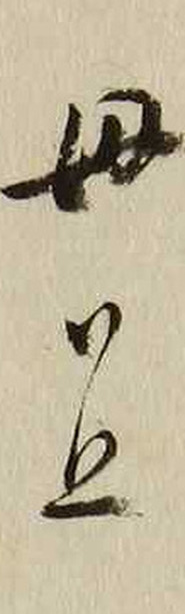母同上
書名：諸士系譜　巻之291　さ之部23
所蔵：会津若松市立会津図書館
